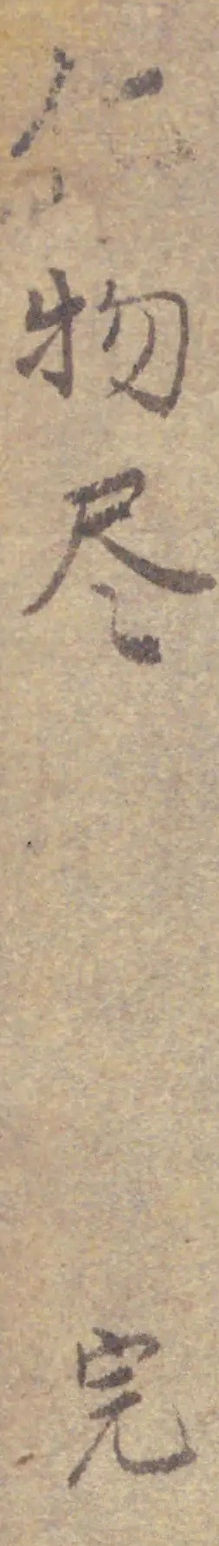化物尽完

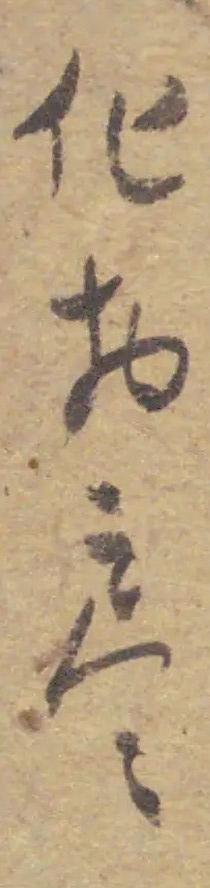化物尽

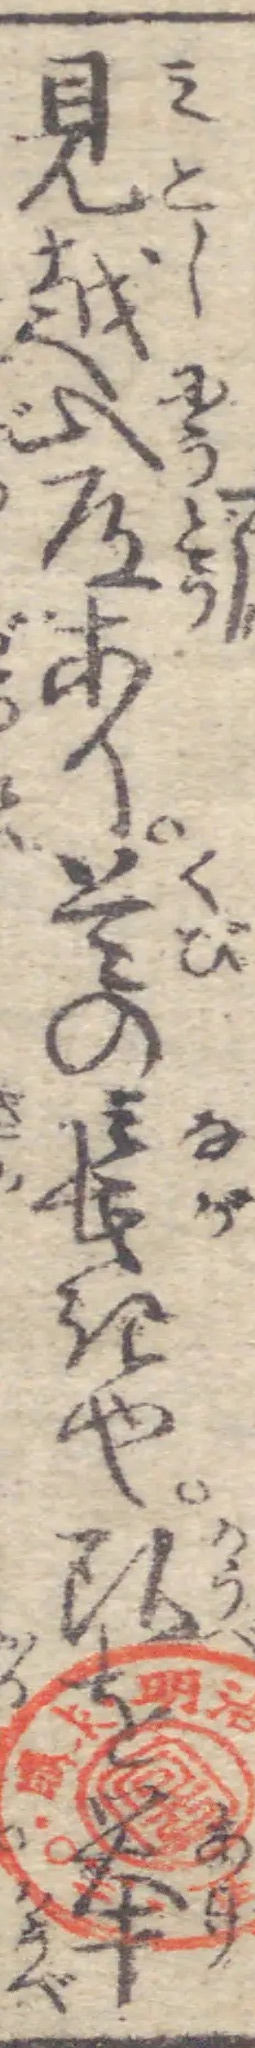見越入道あり。首の長きや。頭を挙
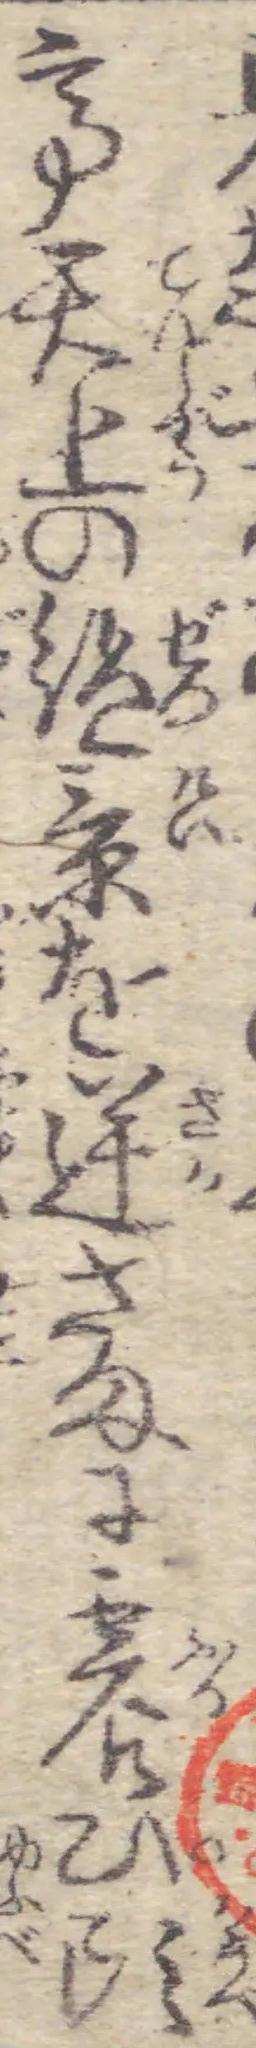て天上の絶景を逆さまに震ひ。頭
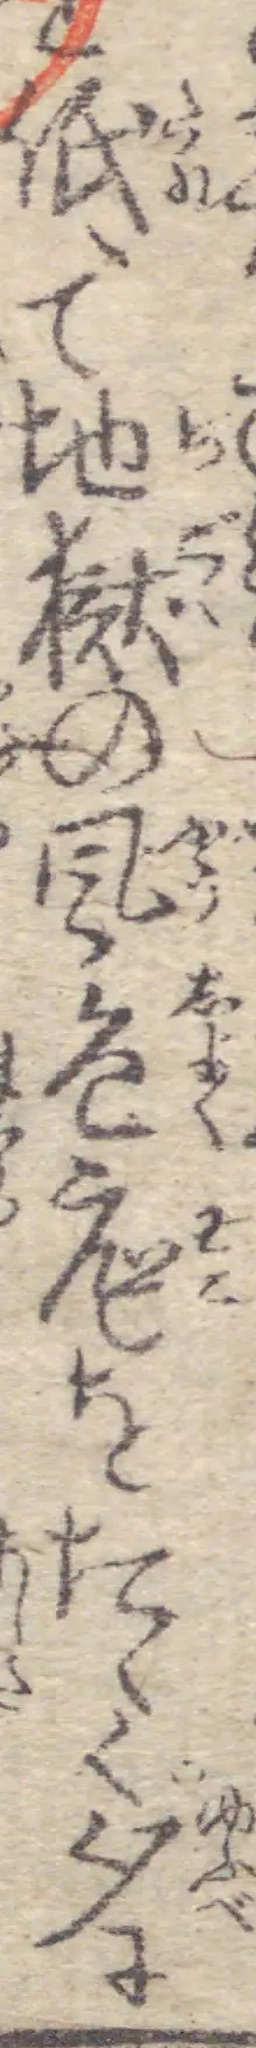を低て地獄の風色底をたゝく夕に
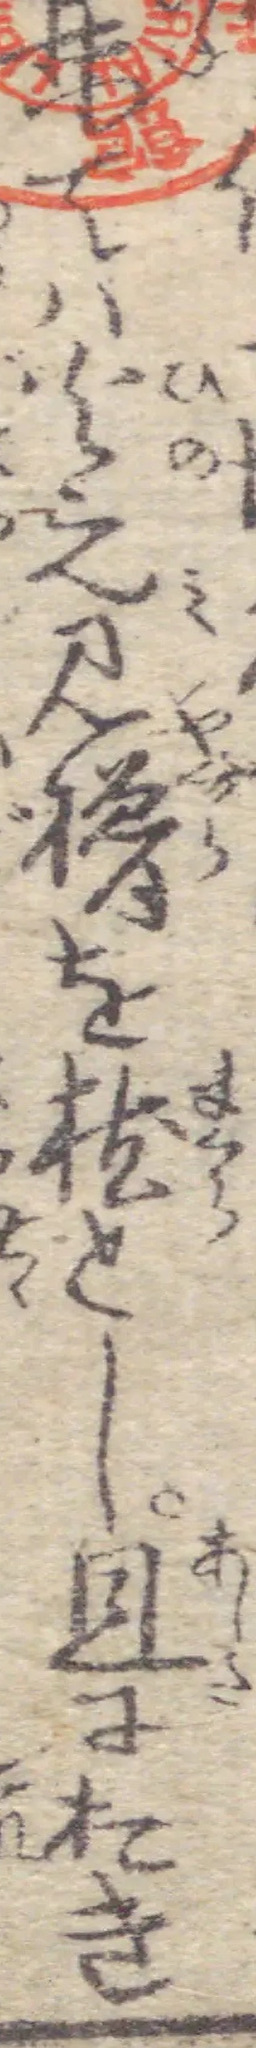寝ては火之見櫓を枕とし旦におき
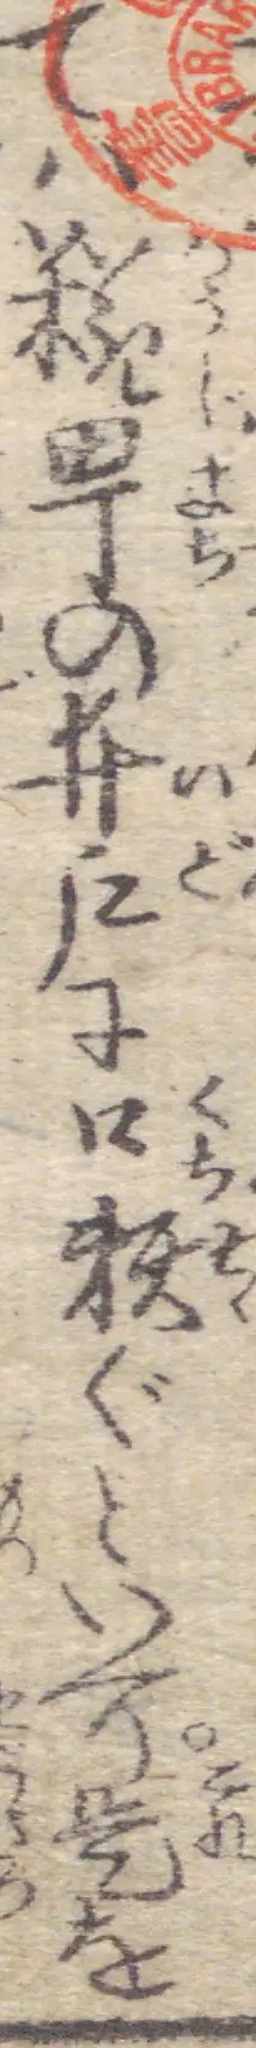ては糀町の井戸に口欶ぐといへり。是を
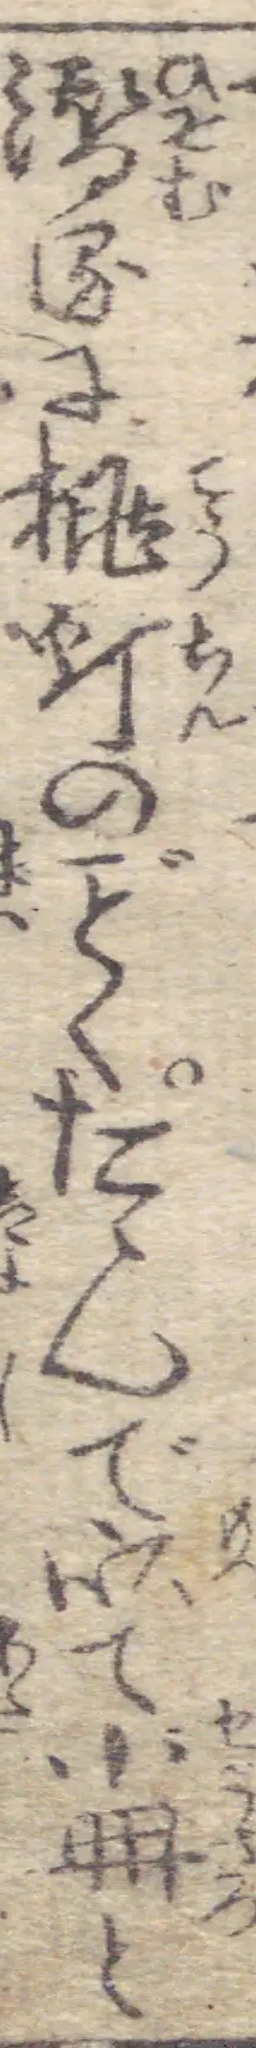潜るに挑灯のごとく。たゝんで以て小冊と
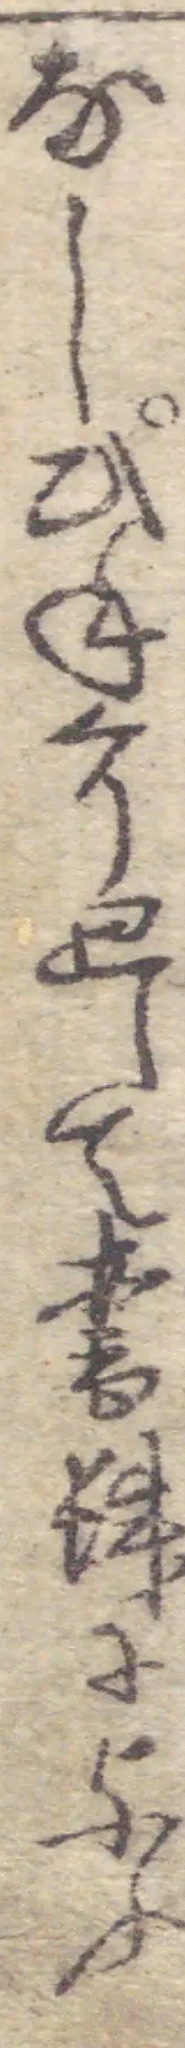なし。ひねくり廻して書肆に与ふ

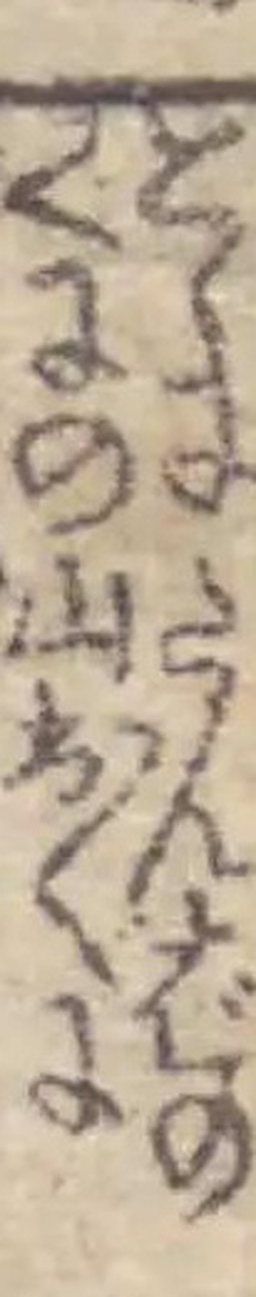くにの山奥に
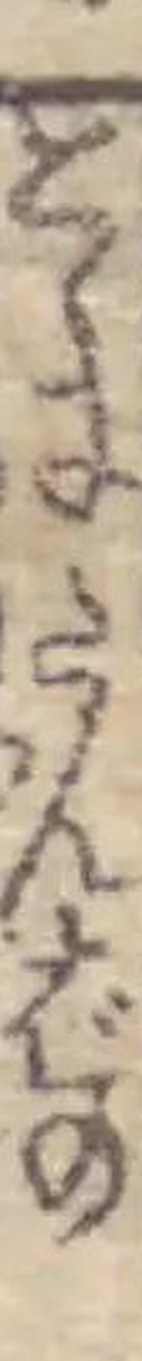こゝにたんばの
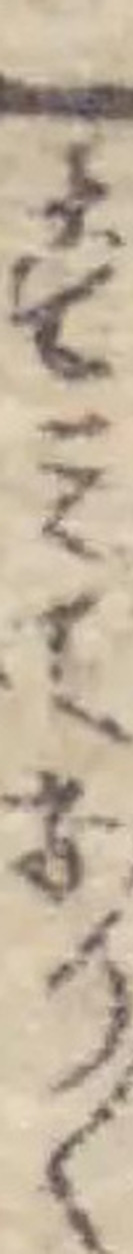すみており〳〵
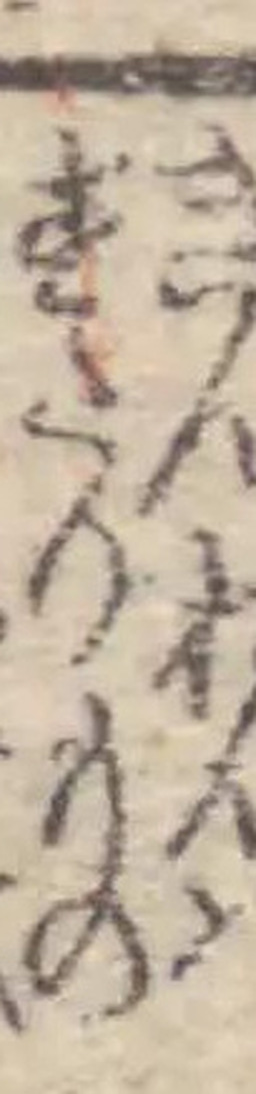すたりもの
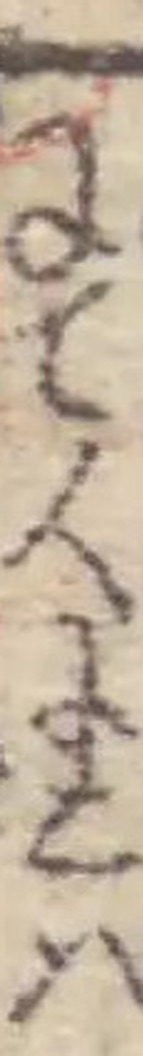にて人にこは
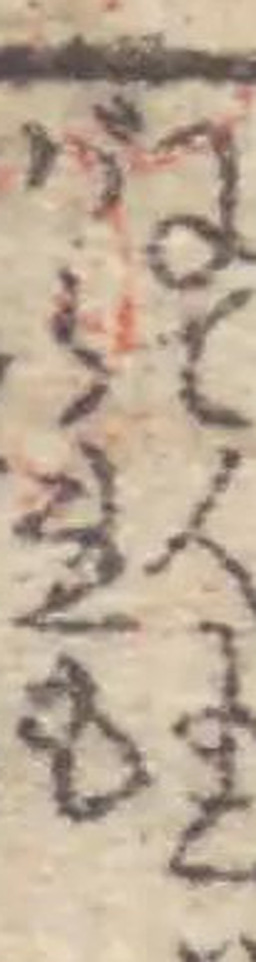がられも
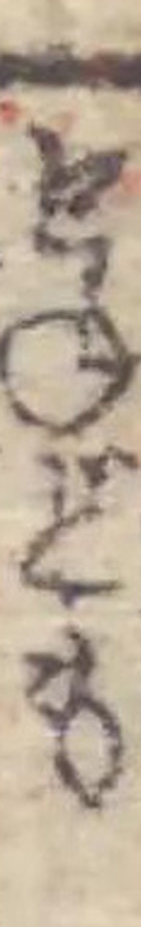せねども
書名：化物尽 4巻
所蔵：国立国会図書館 National Diet Library, JAPAN
